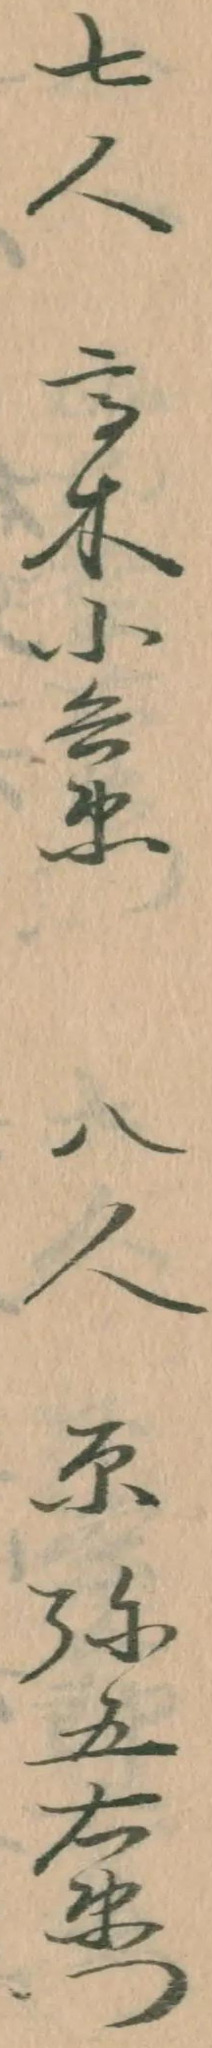七人高木小兵衛八人原弥五右衛門
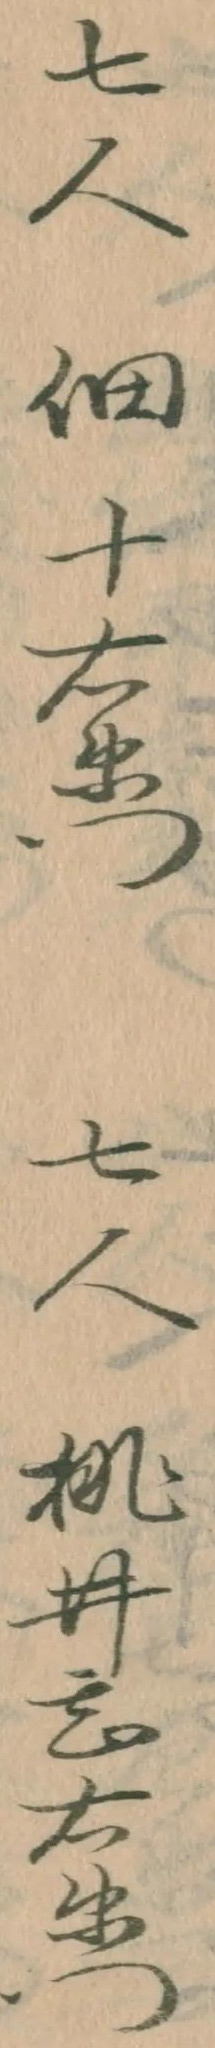七人佃十右衛門七人桃井甚右衛門
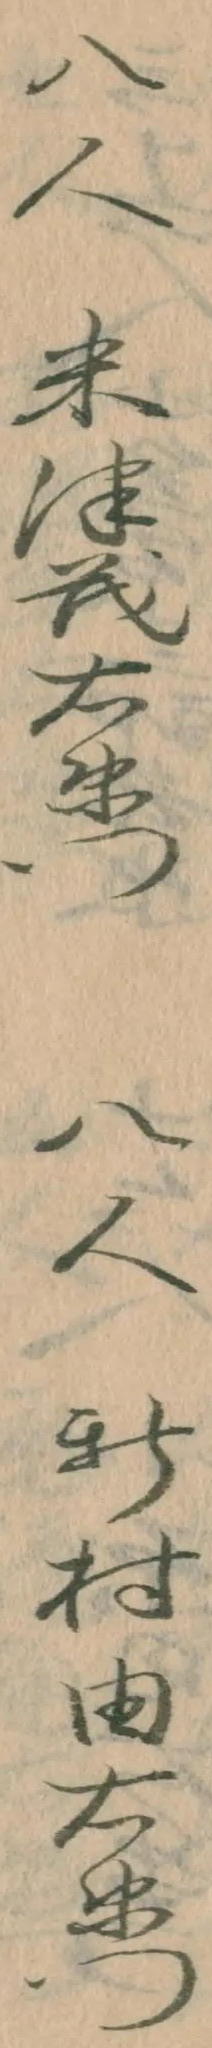八人米津茂右衛門八人新村由右衛門
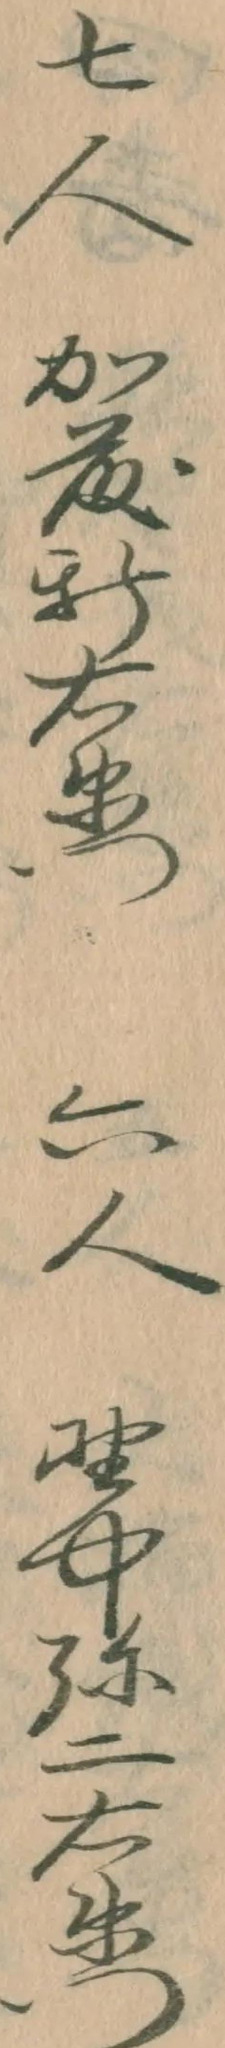七人加藤新右衛門六人野中弥二右衛門
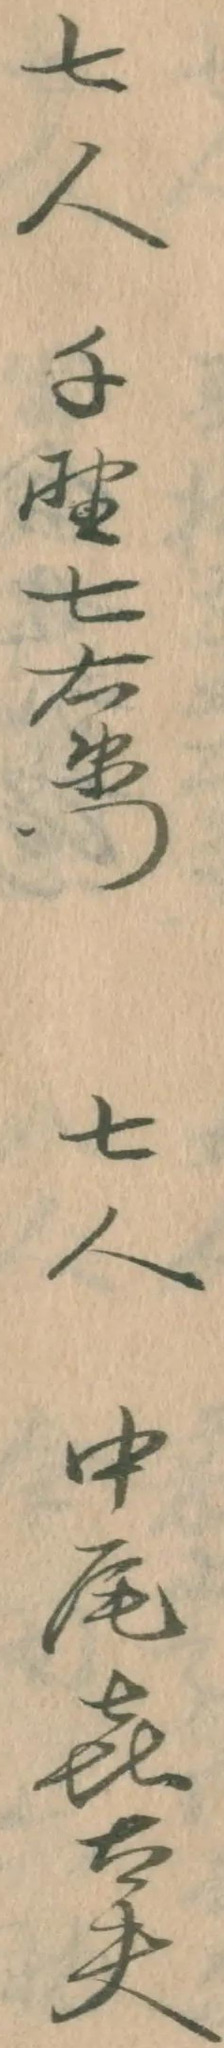七人千野七右衛門七人中尾喜太夫
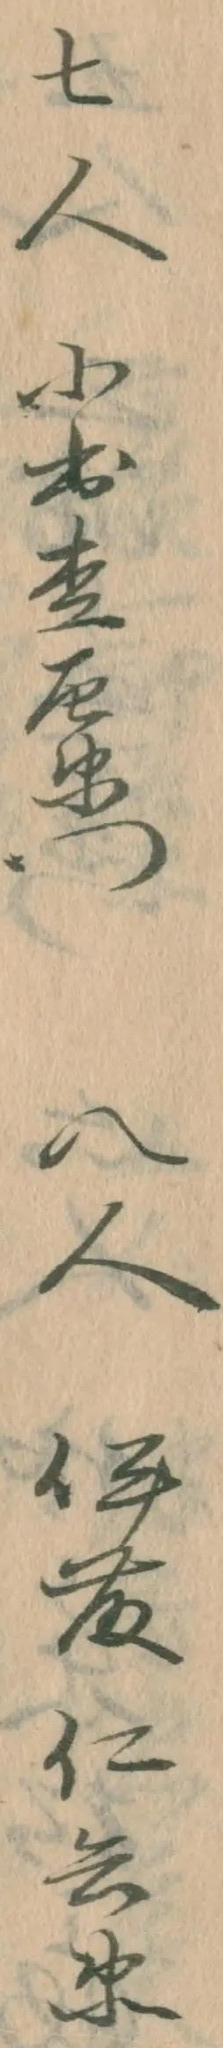七人小出杢左衛門八人伊藤仁兵衛
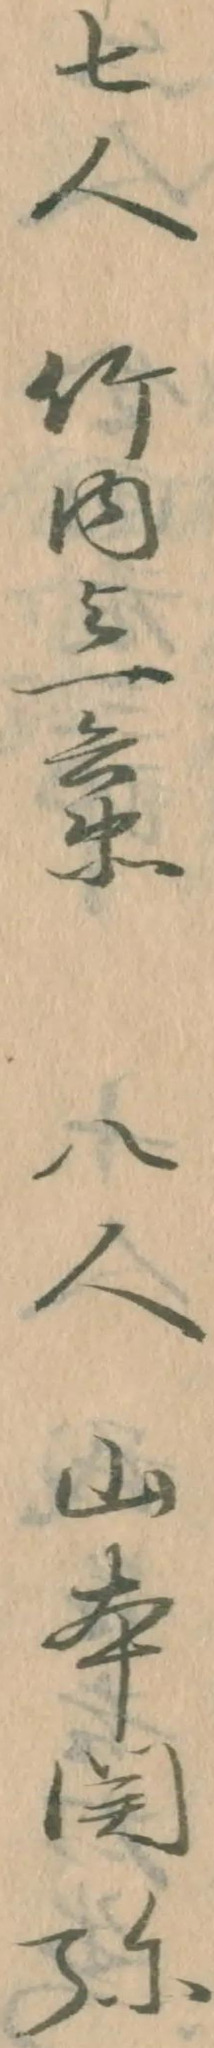七人竹内与一兵衛八人山本関弥

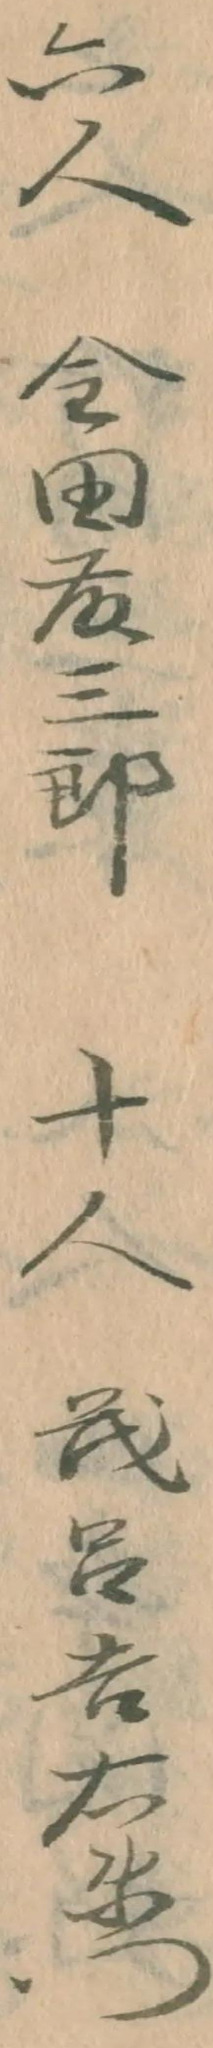六人金田藤三郎十人茂呂吉右衛門
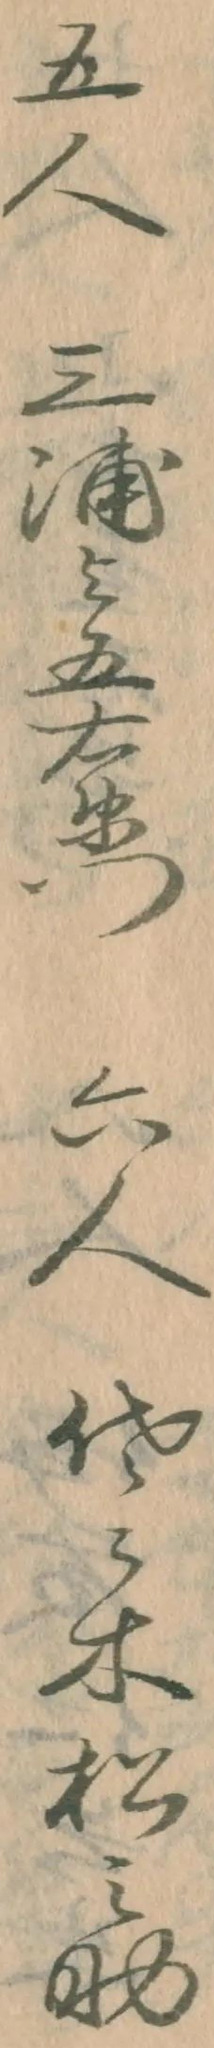五人三浦与五右衛門六人佐々木松之助
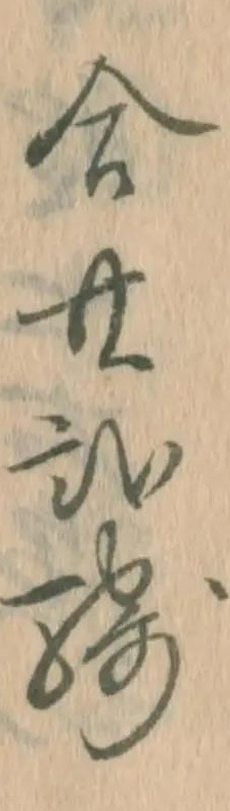合廿弐騎
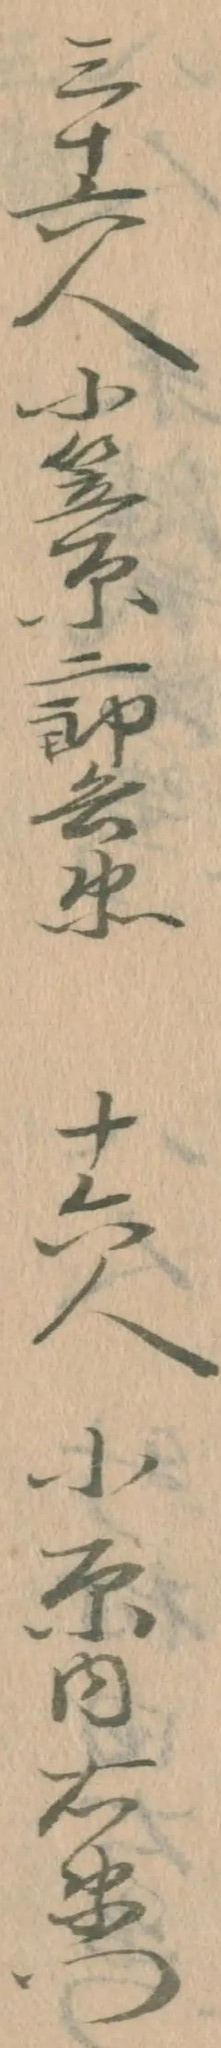三十六人小笠原二郎兵衛十六人小原内右衛門
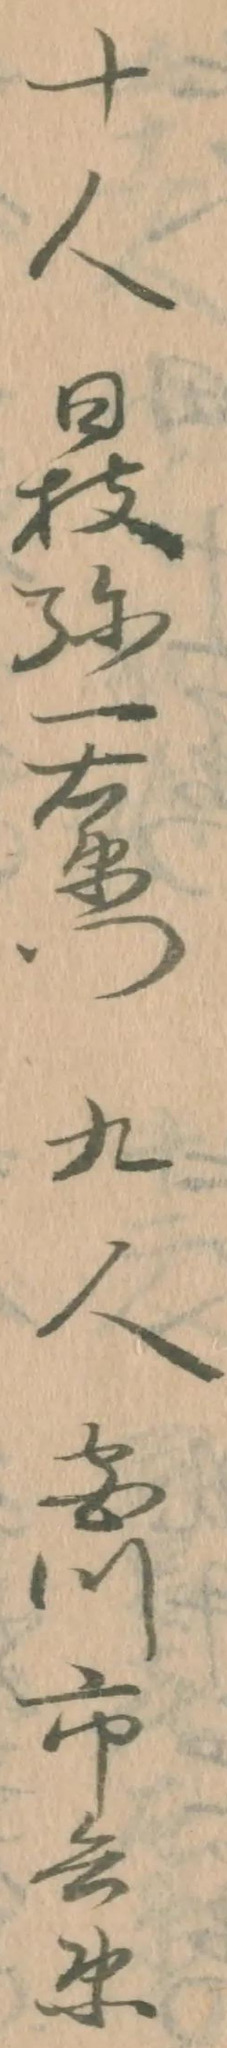十人日枝弥一右衛門九人宮川市兵衛
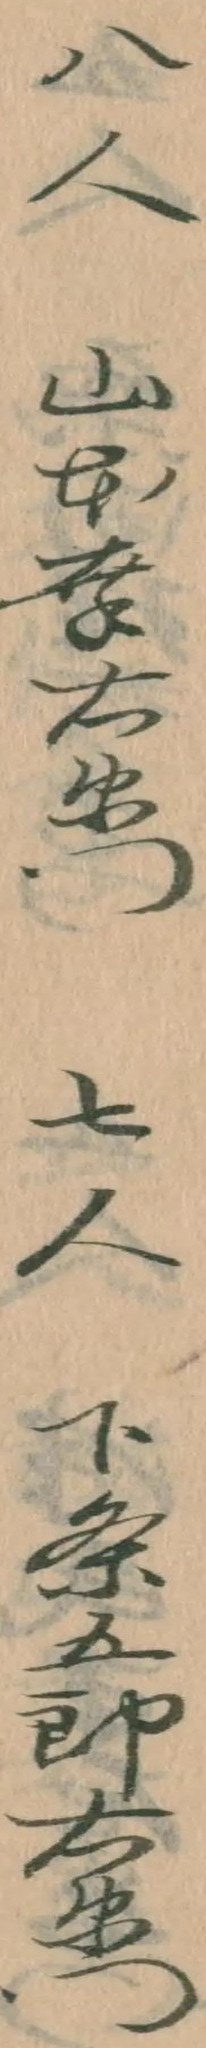八人山本幸右衛門七人下条五郎右衛門
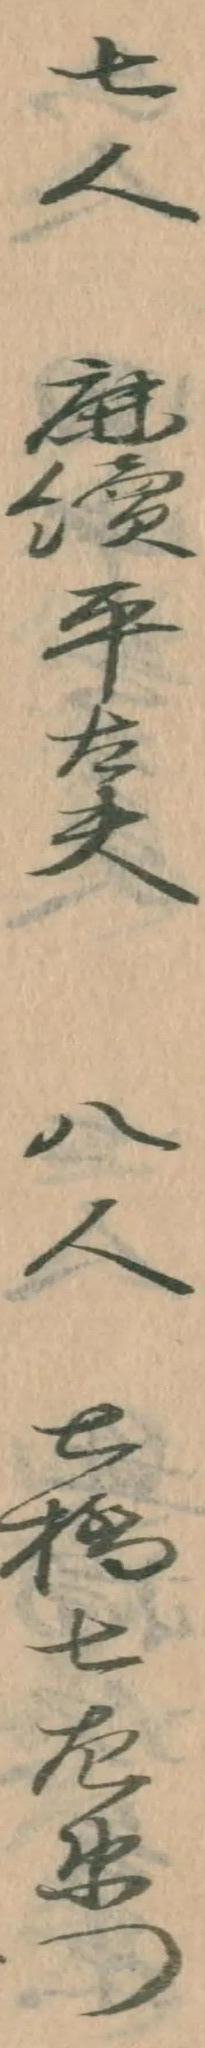七人鹿続平太夫八人土橋七左衛門
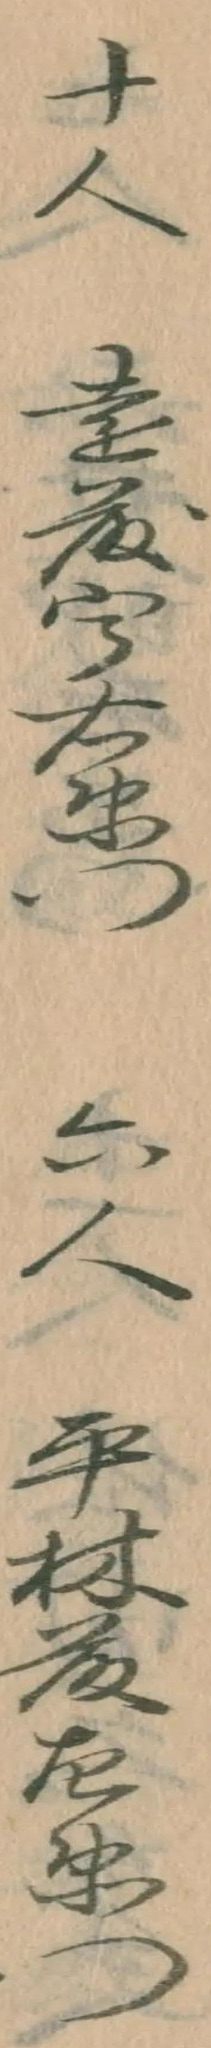十人遠藤宇右衛門六人平林藤左衛門
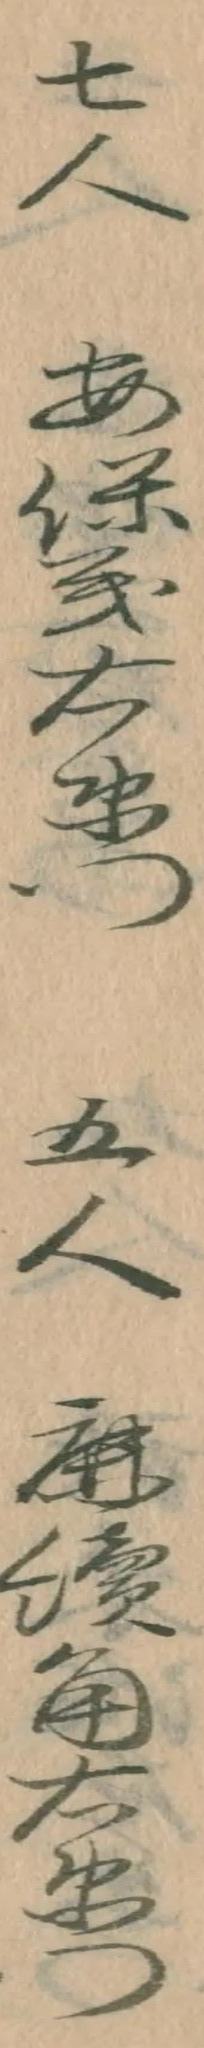七人安保義右衛門五人鹿続角右衛門
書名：切支丹御退治記 49巻. [6]
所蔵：国立国会図書館 National Diet Library, JAPAN
